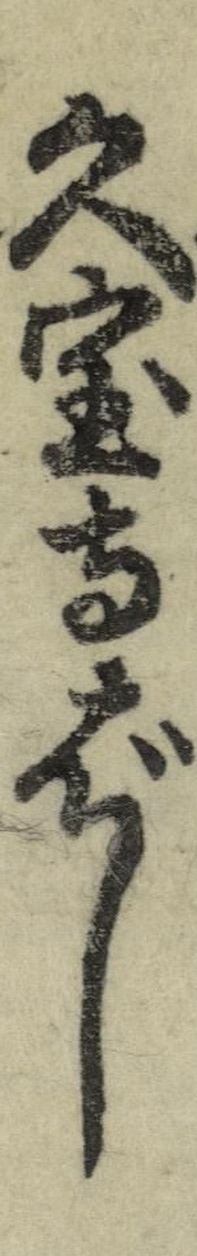久宝寺ばし
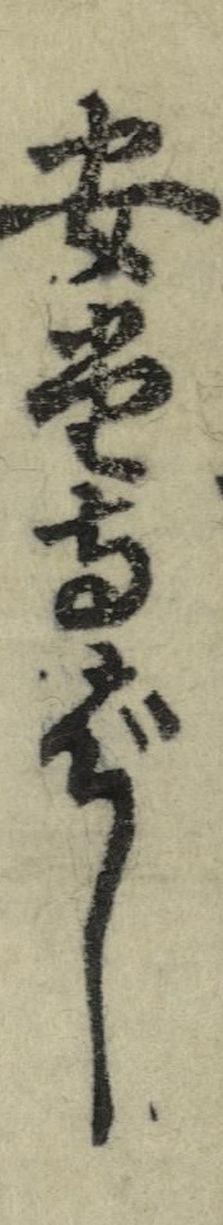安堂寺ばし
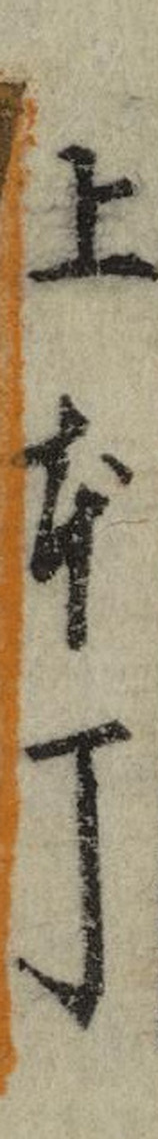上本丁
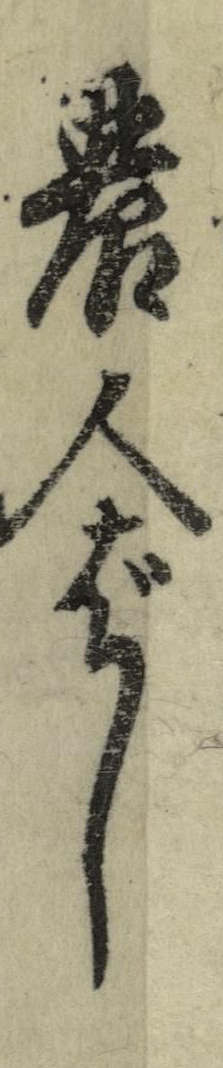農人ばし
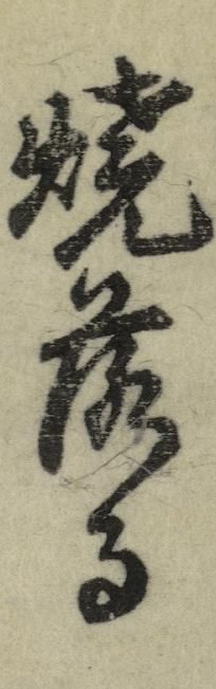焼落る
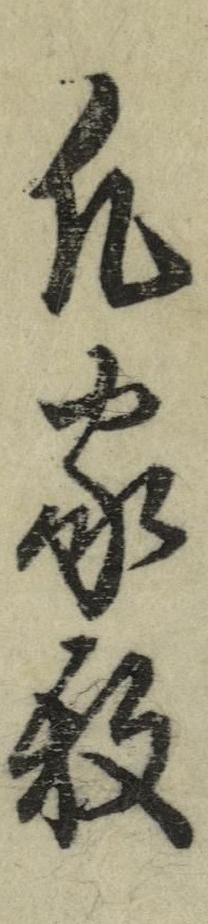凡家数
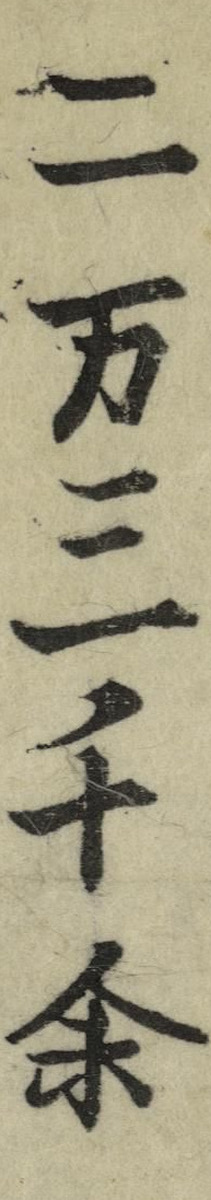二万三千余
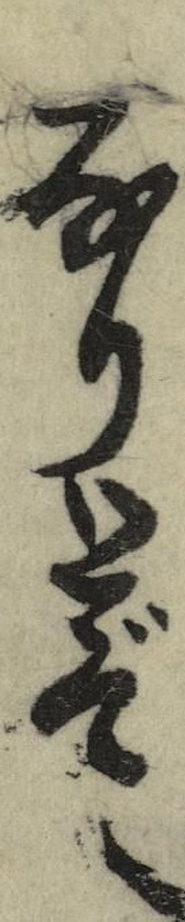なりとぞ
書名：大坂大火本しらべ
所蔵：東京大学地震研究所図書室 Earthquake Research Institute Library, The University of Tokyo, JAPAN
